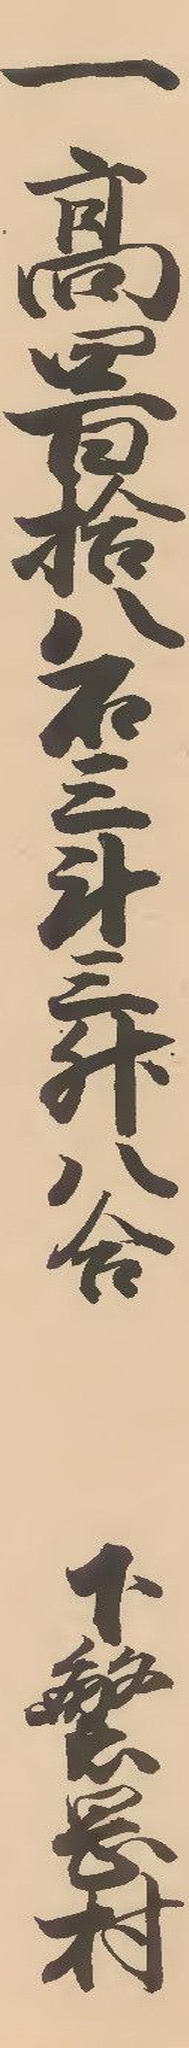一高四百拾八石三斗三升八合下繁岡村
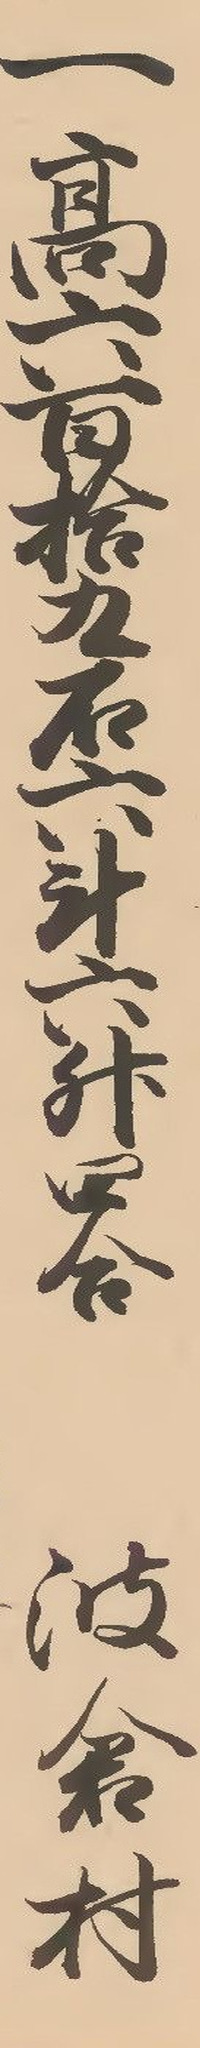一高六百拾九石六斗六升四合波倉村
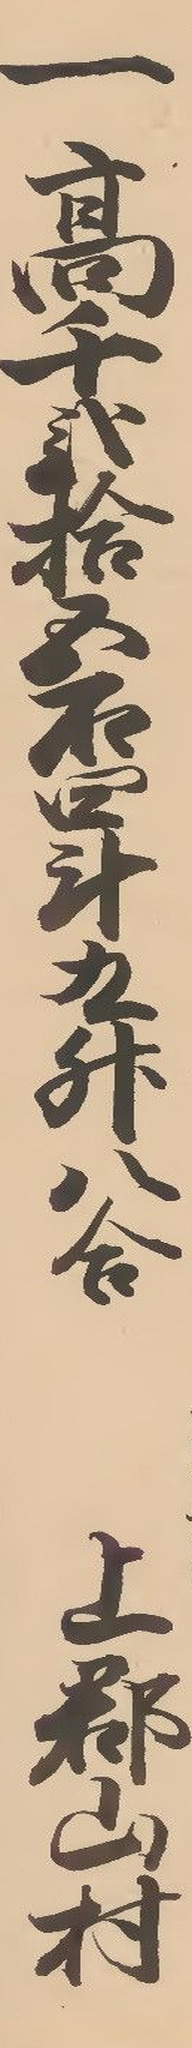一高千弐拾五石四斗九升八合上郡山村
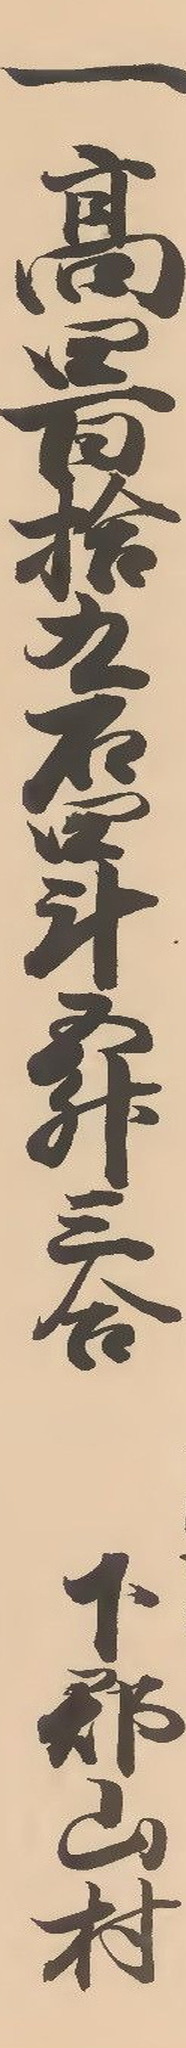一高四百拾九石四斗五升三合下郡山村
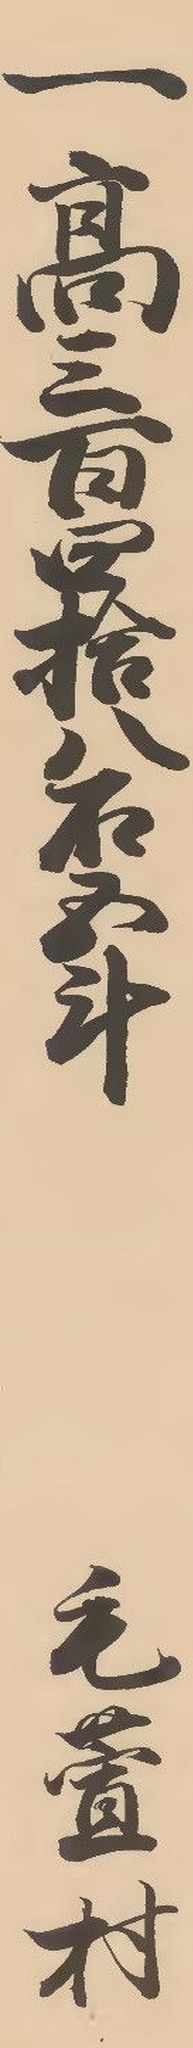一高三百四拾八石五斗毛萱村
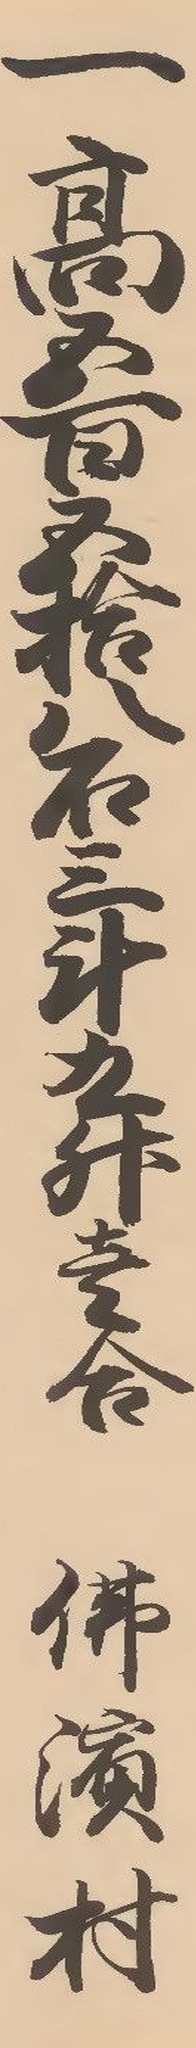一高五百五拾八石三斗九升壱合仏浜村
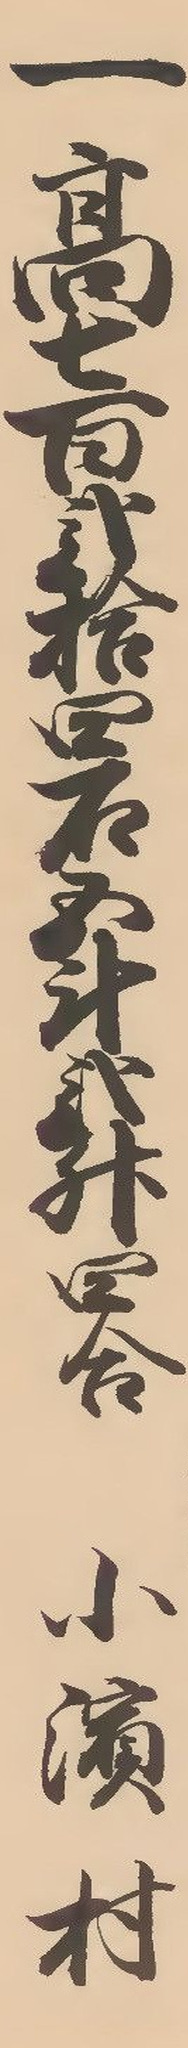一高七百弐拾四石五斗弐升四合小浜村

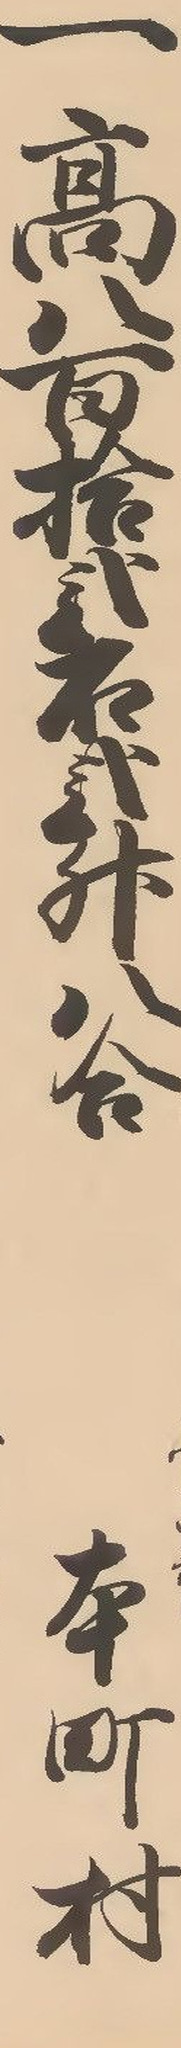一高八百拾弐石弐升八合本町村
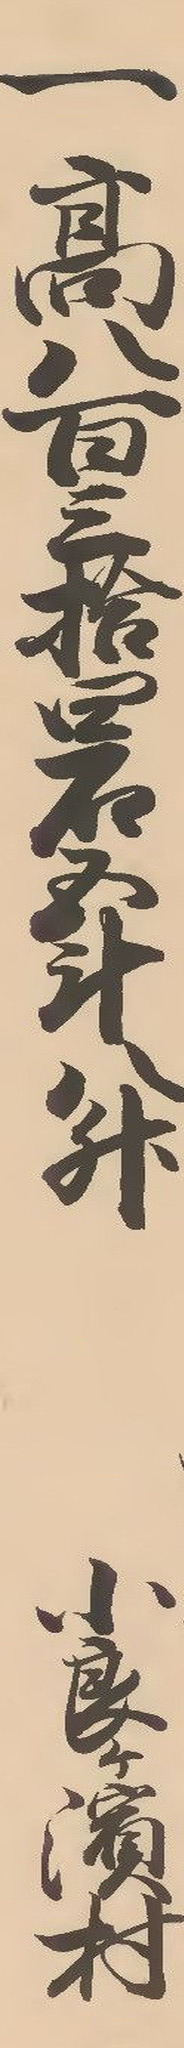一高八百三拾四石五斗八升小良ヶ浜村
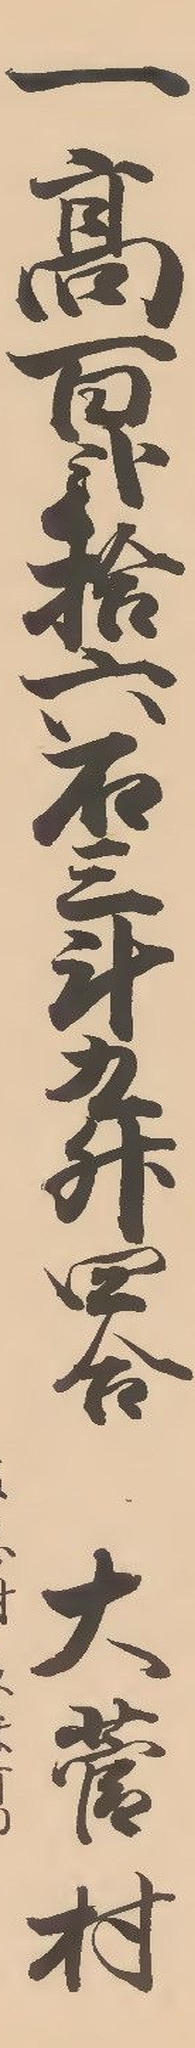一高百弐拾六石三斗九升四合大菅村
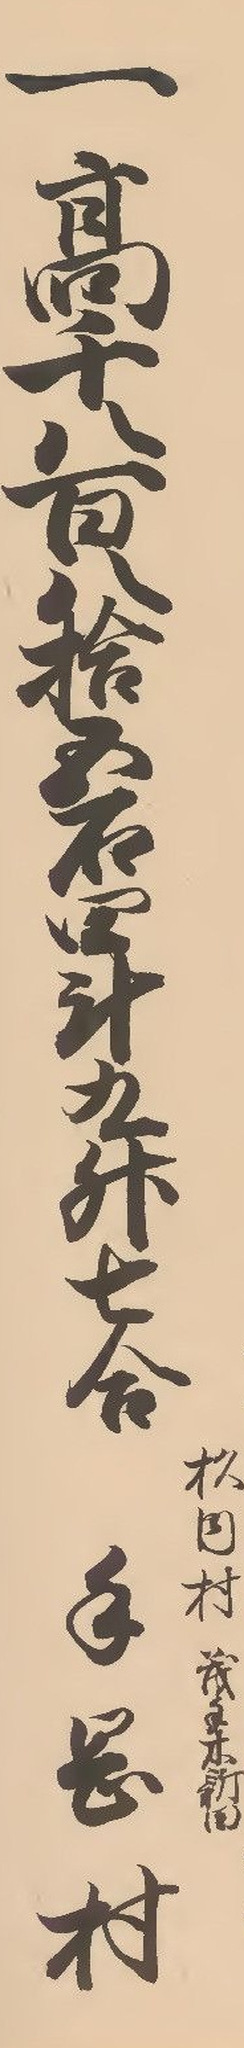一高千八百八拾五石四斗九升七合手岡村
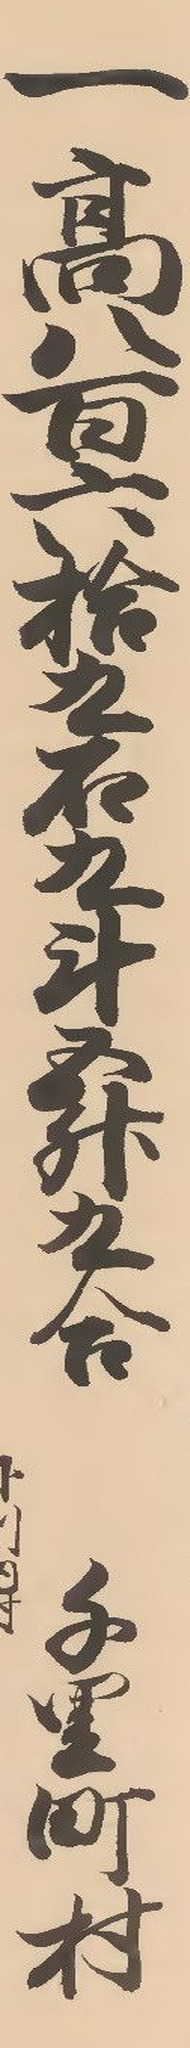一高八百六拾九石九斗五升九合千里町村
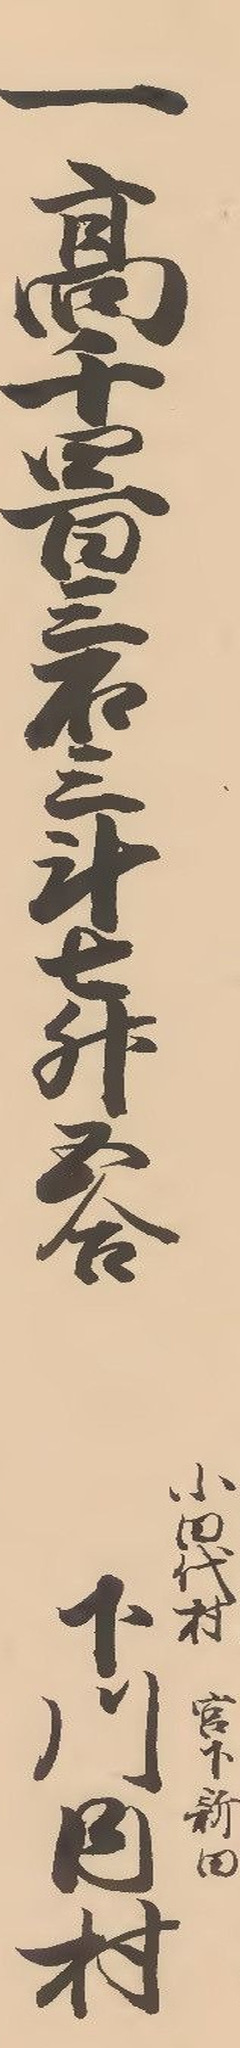一高千四百三石三斗七升五合下川内村
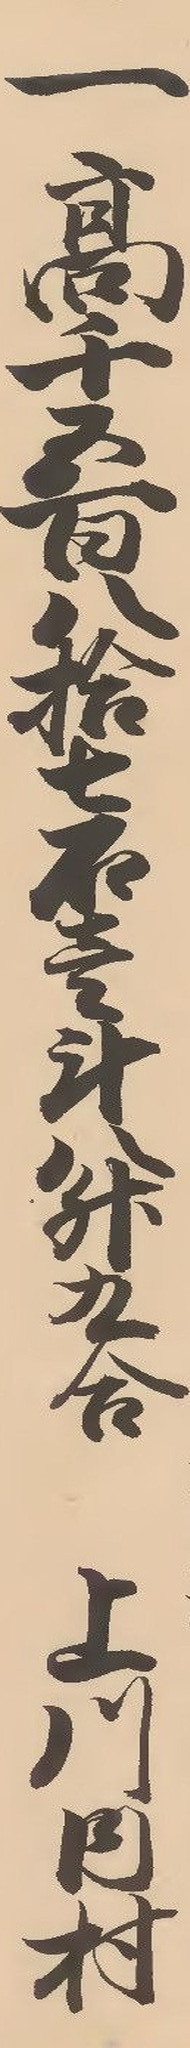一高千五百八拾七石壱斗八升九合上川内村
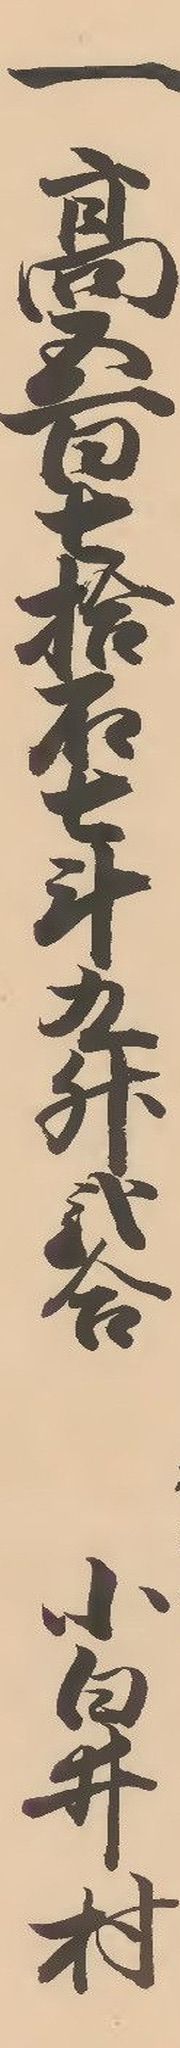一高五百七拾石七斗九升弐合小白井村

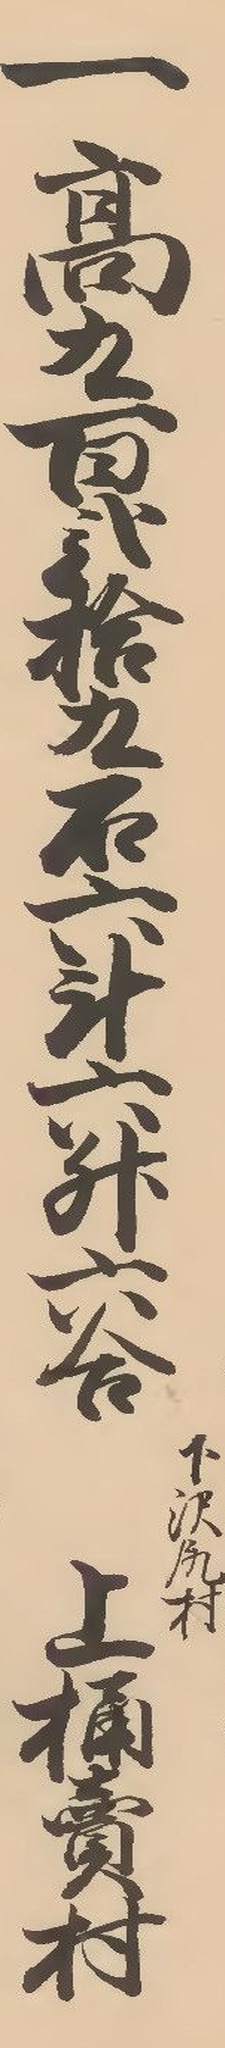一高九百弐拾九石六斗六升六合上桶売村
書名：陸奥国郷帳　３
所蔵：国立公文書館 National Archives of Japan
